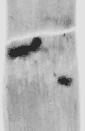十一
